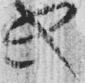女（如）
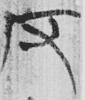反
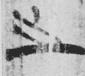之
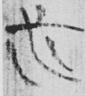必
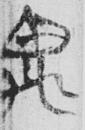禺（遇）
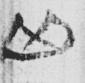凶
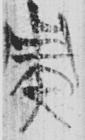央（殃）
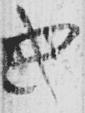母
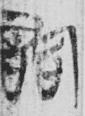○（詬）
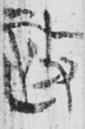政
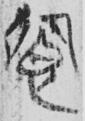卿
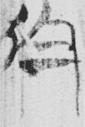於
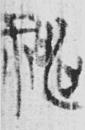神
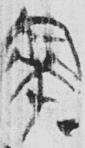○（次）
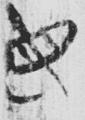母
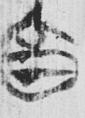○（享）
